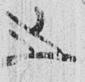之
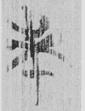未
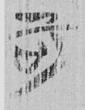可
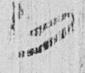㠯（以）
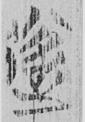遂
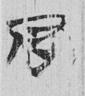君
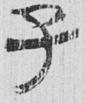子
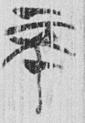不
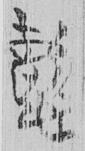○（慎）
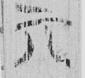亓
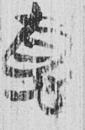惪（德）
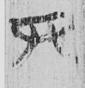四
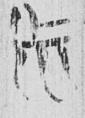○（荒）
